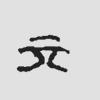亓（其）
